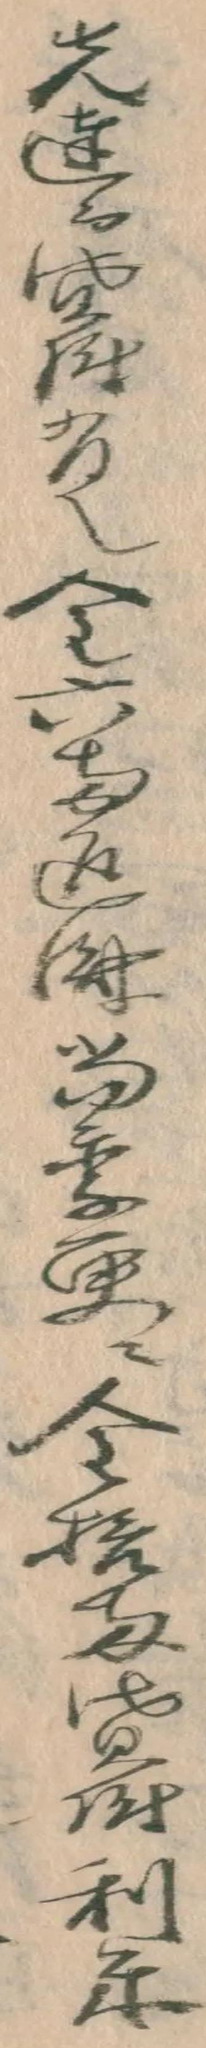先達而貸附有之金六両返済當季更ニ金拾両貸附利米
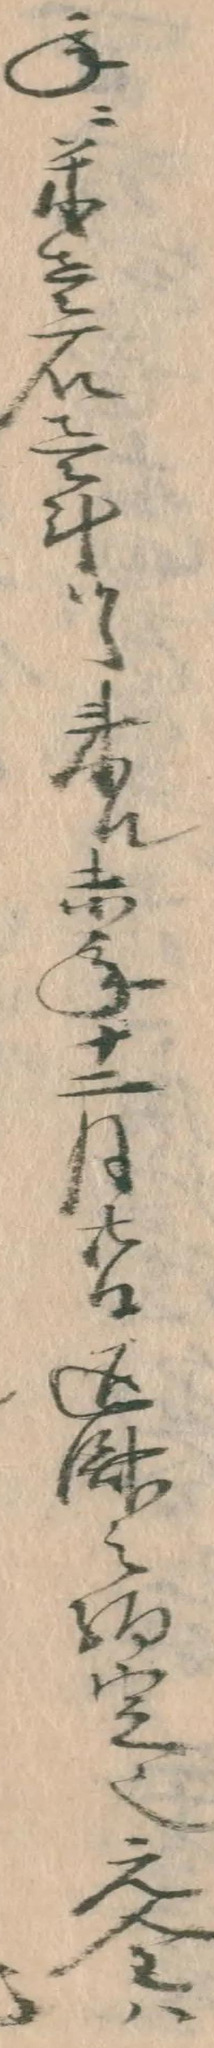年ニ米壱石壱斗ツヽ来ル未年十二月廿日返済之約定也元金ハ
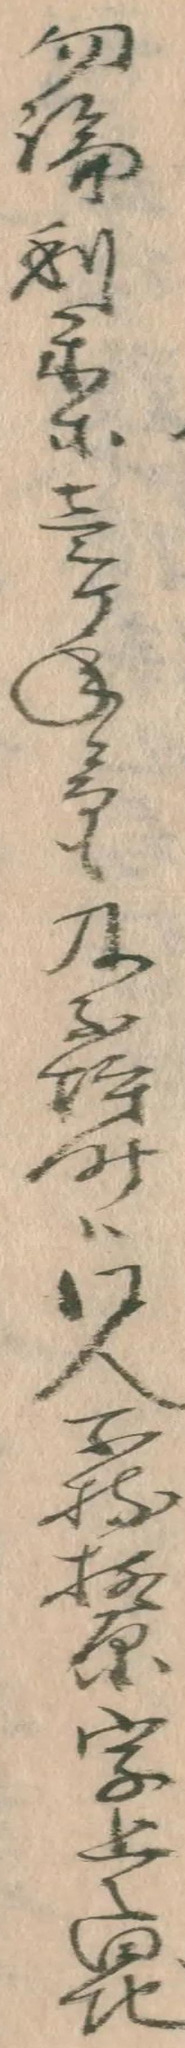勿論利示等壱ヶ年二而も及不埒時ハ同人所持柊原字上之田地
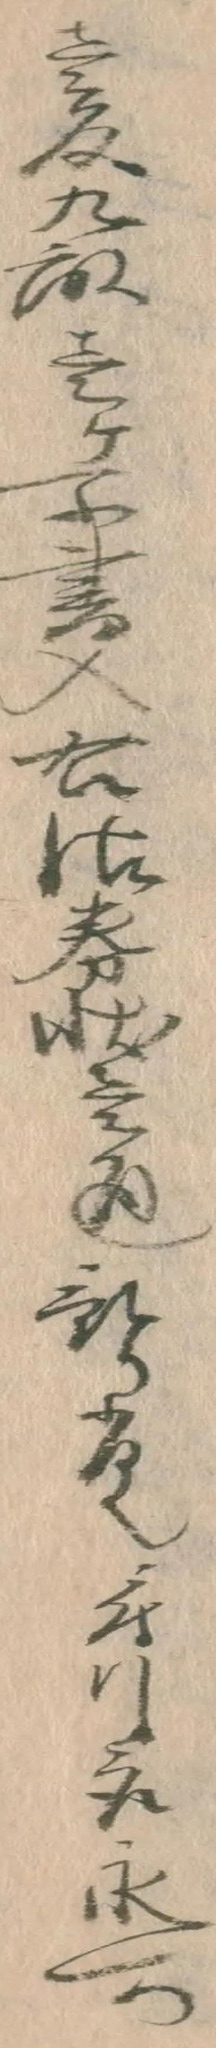壱反九畝壱ケ所書入右沽券状壱通預り有之ニ付引取永可
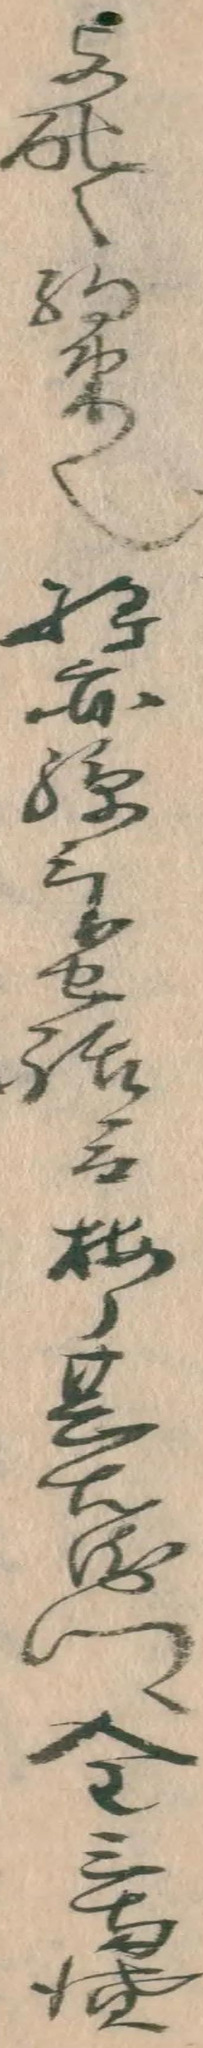支配之約束也孫亦源三郎世話二而梅ノ甚右衛門へ金三両貸
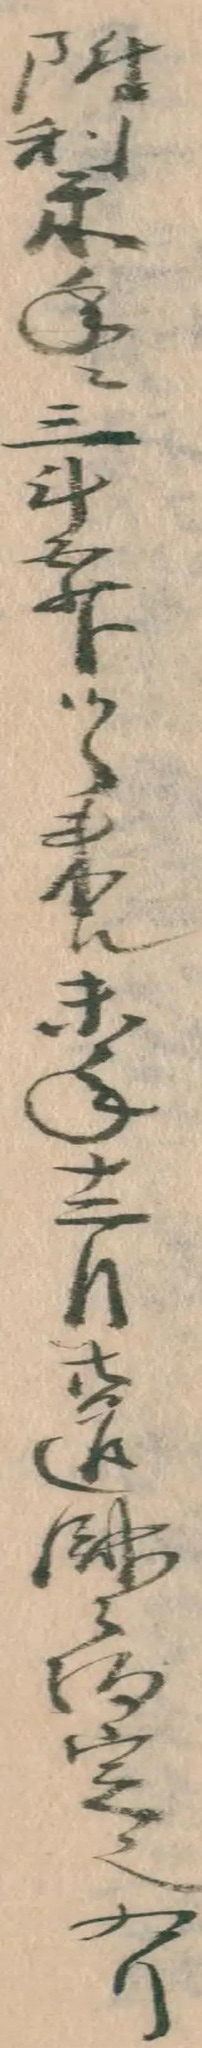附利米年ニ三斗五歩ツヽ来ル未年十二月廿日返済之約定也九月
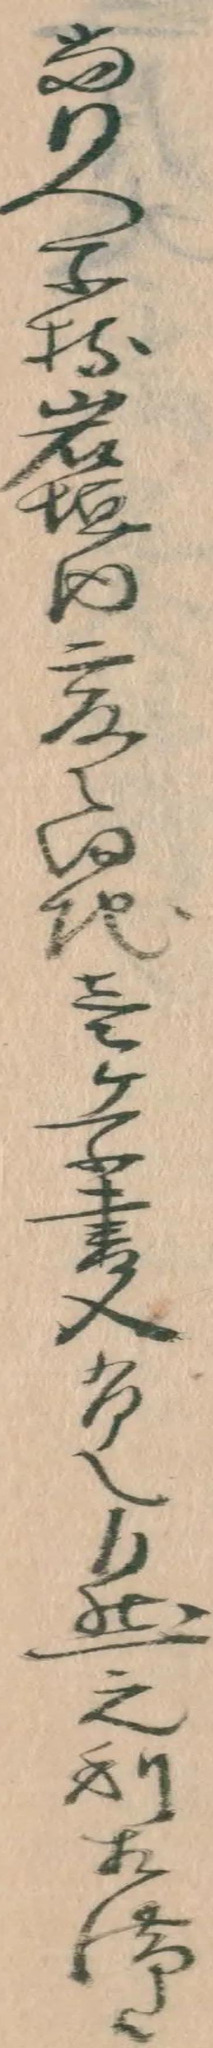當同人所持岩垣内二反之田地壱ケ所書入有之自然元利相滞候
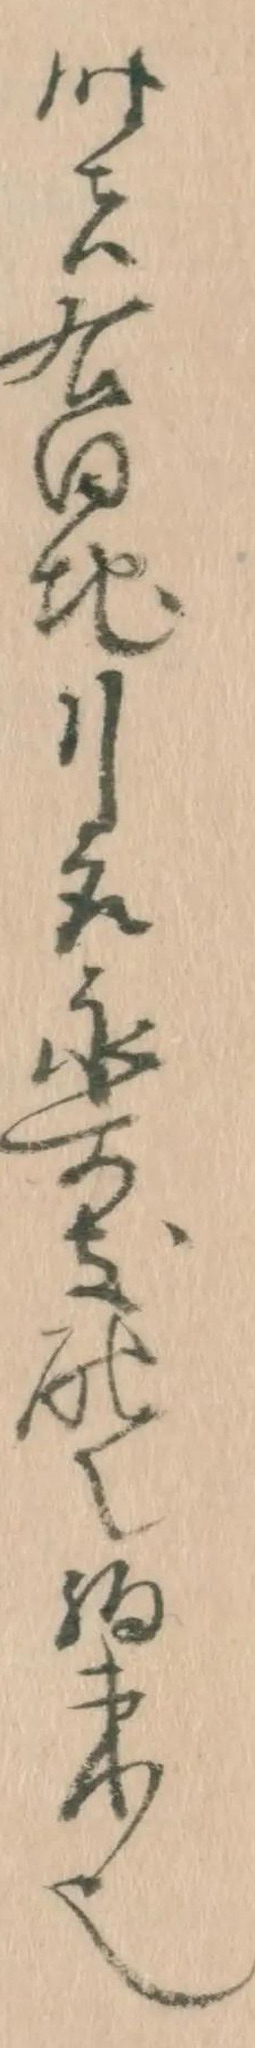時は右同地引取永可支配之約束也
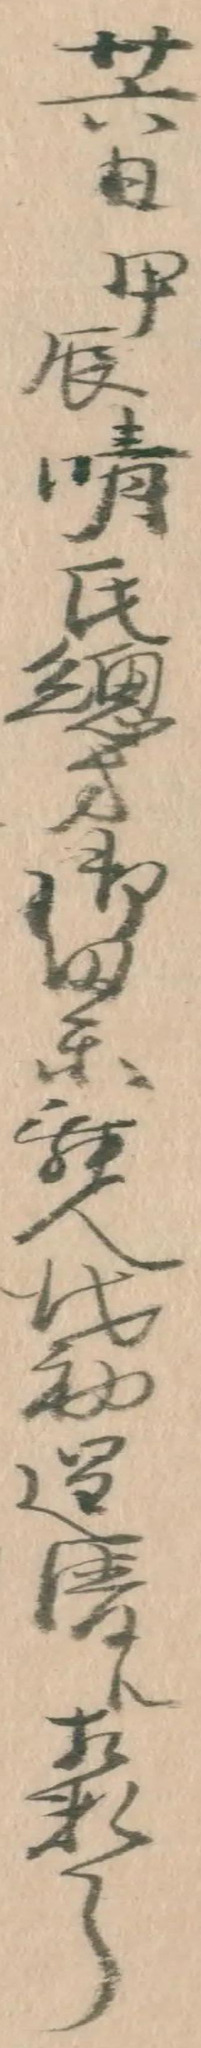廿六日甲辰晴氏總方御田楽舞人代勤逞清江相頼了
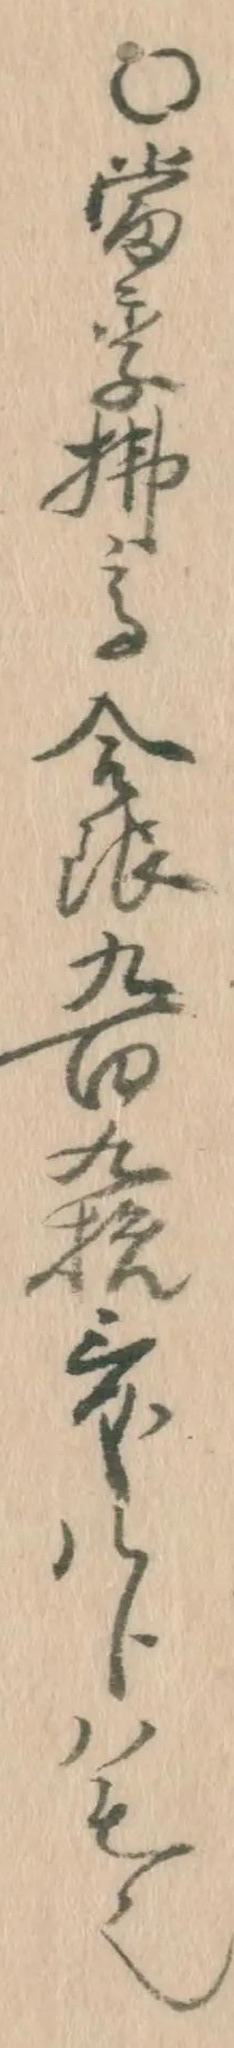〇當季払高合銀九百九拾三匁八分八毛也

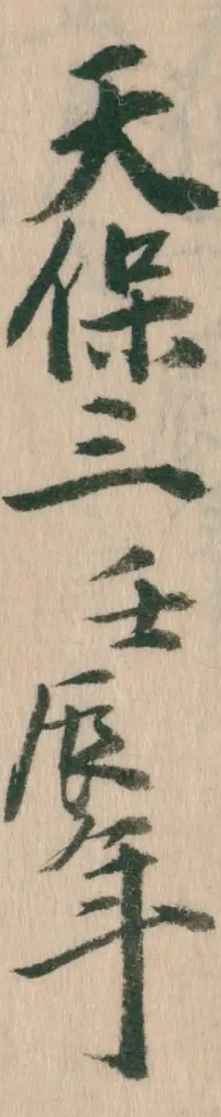天保三壬辰年
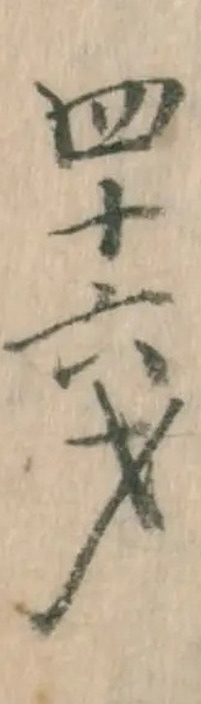四十六才

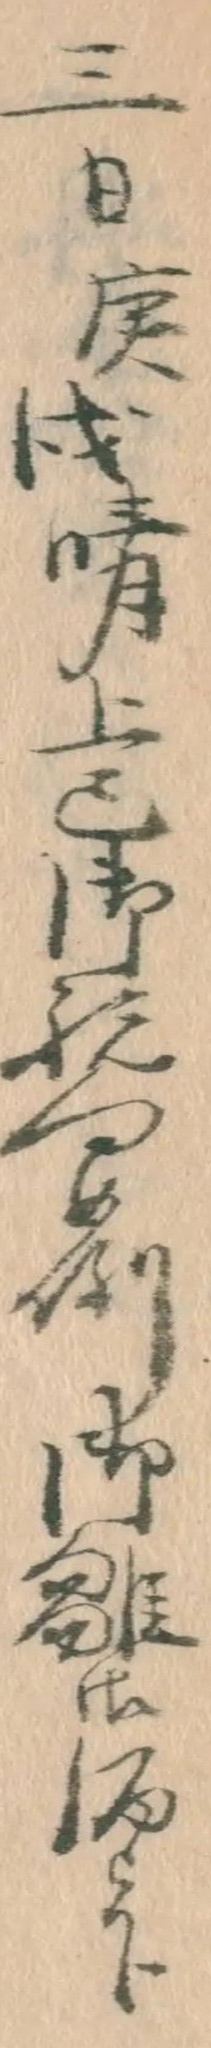三日庚戌晴上巳御祝向如例御雛御酒被下
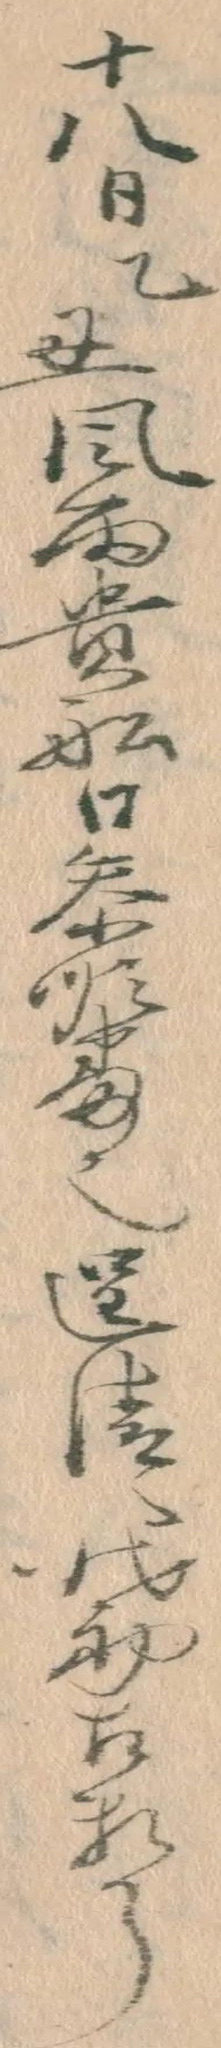十八日乙丑風雨貴舩日参順番也逞清へ代勤相頼了
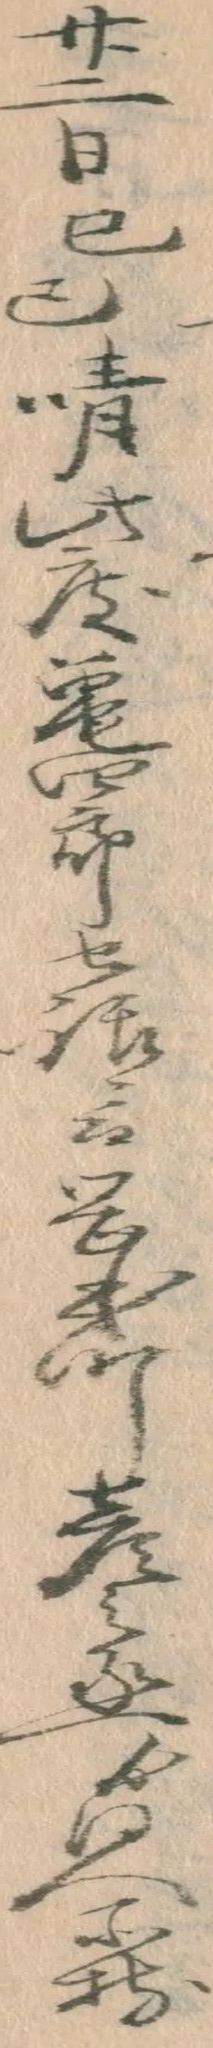廿二日己巳晴此度亀四郎世話ニ而岡本町彦之丞ゟ同人所持
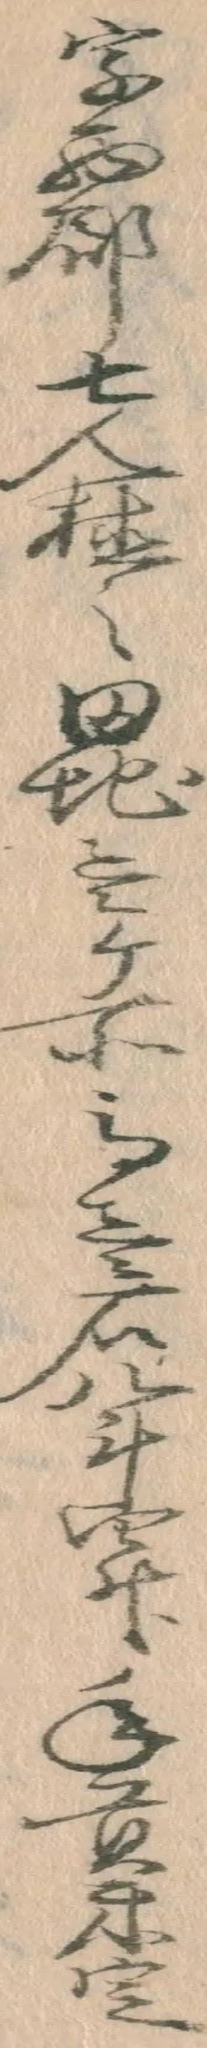字西郡七人植之田地壱ヶ所高壱石八斗四升年貢米定
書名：賀茂社記録. 第66冊
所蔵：国立国会図書館 National Diet Library, JAPAN
